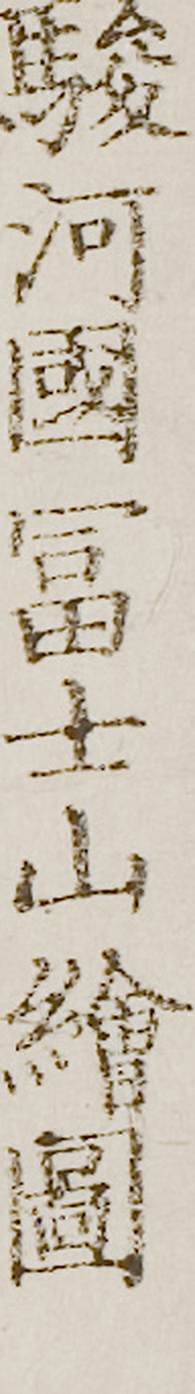駿河国冨士山絵図
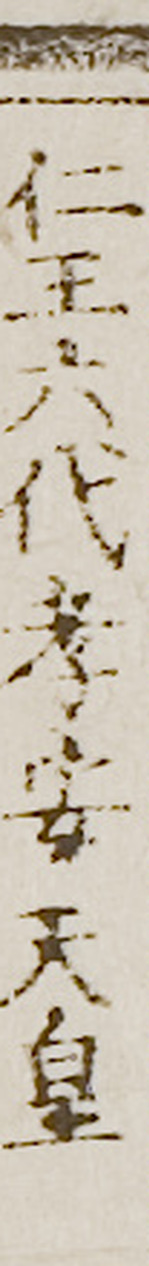仁王六代孝安天皇
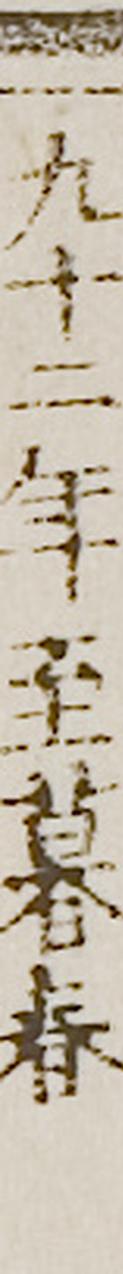九十二年至暮春
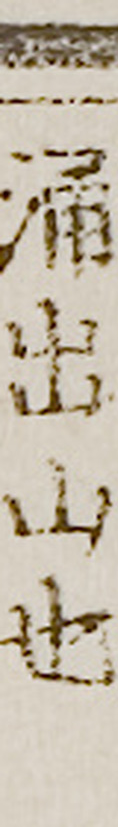涌出山也
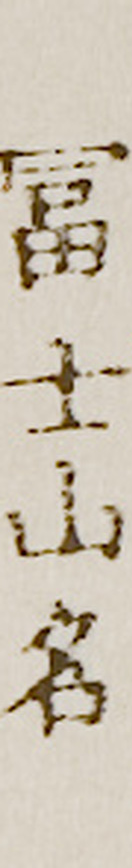冨士山名
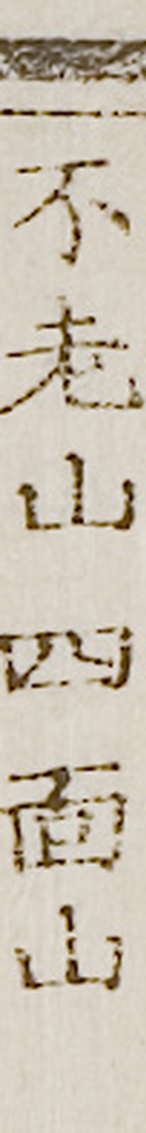不老山四面山
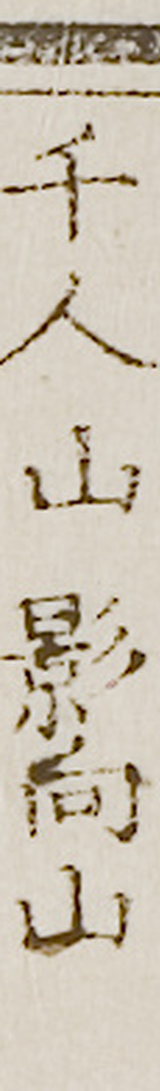千人山影向山
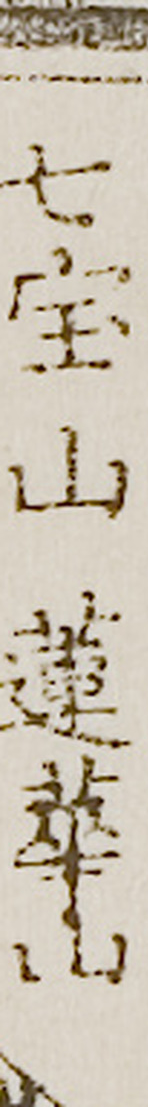七宝山蓮華山
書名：駿河国富士山絵図
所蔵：東京大学総合図書館 General Library in the University of Tokyo, JAPAN
